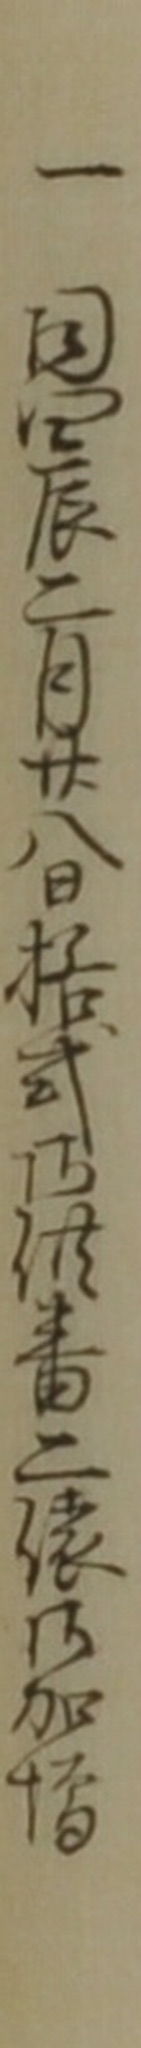一同四辰二月廿八日格式御供番二俵御加増
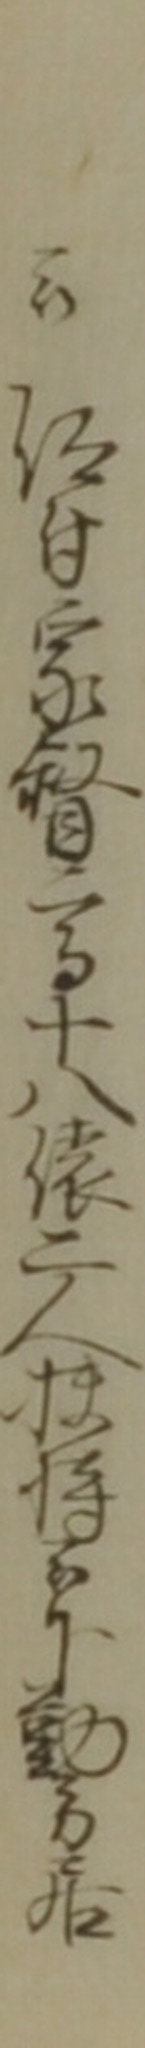被仰付家督高十八俵二人扶持被下勤方居
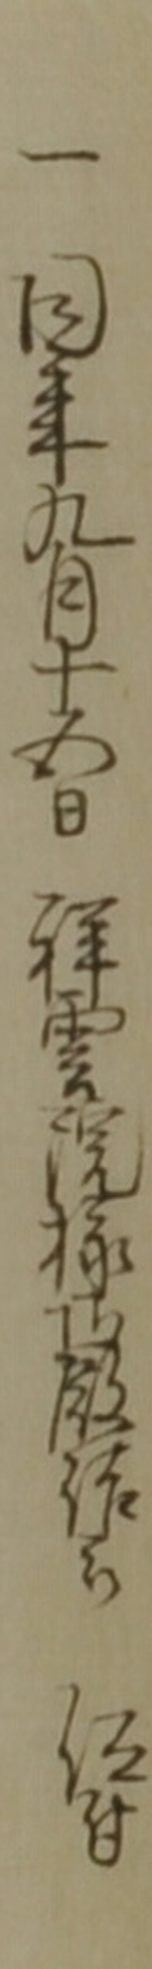一同年九月十五日祥雲院様御殿詰被仰付
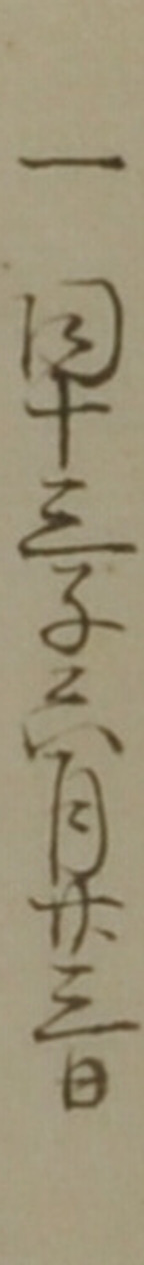一同十三子六月廿三日
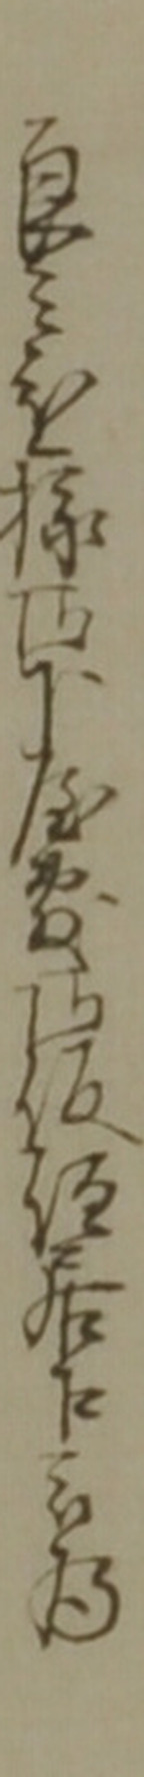良之進様御下屋敷御仮住居江被為
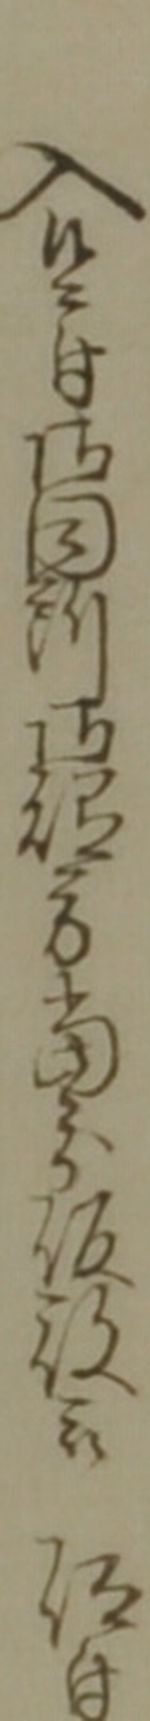入候ニ付御同所御賄方当分仮役被仰付
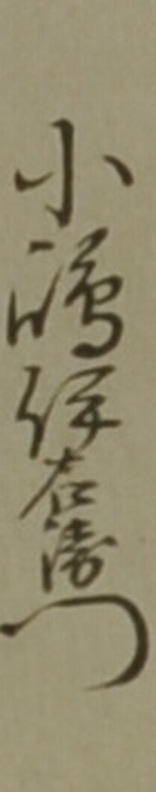小嶋伊右衛門
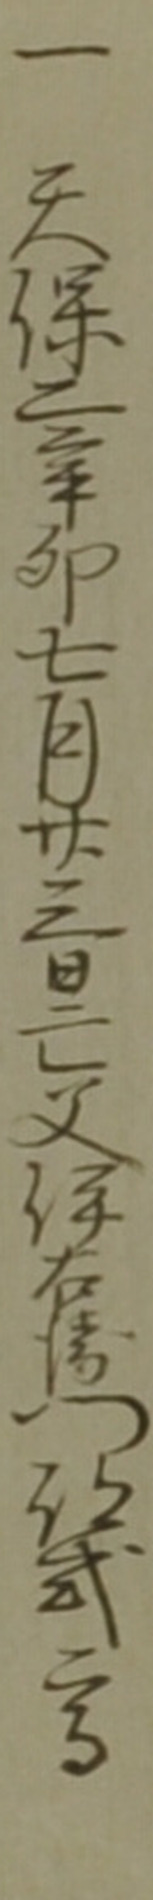一天保二辛卯七月廿三日亡父伊右衛門跡式高
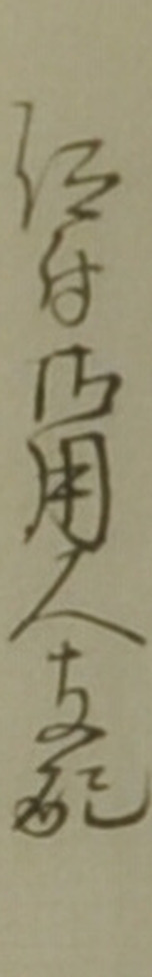仰付御用人支配

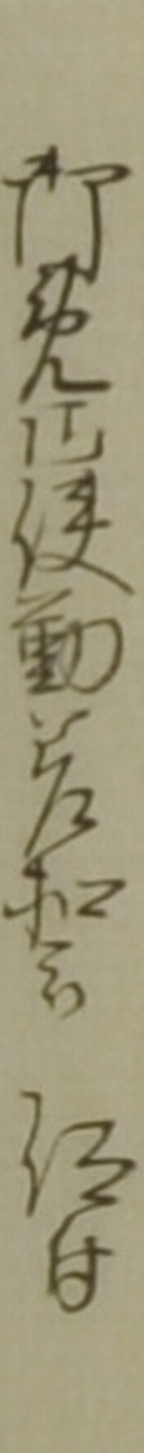御免御使勤差控被仰付
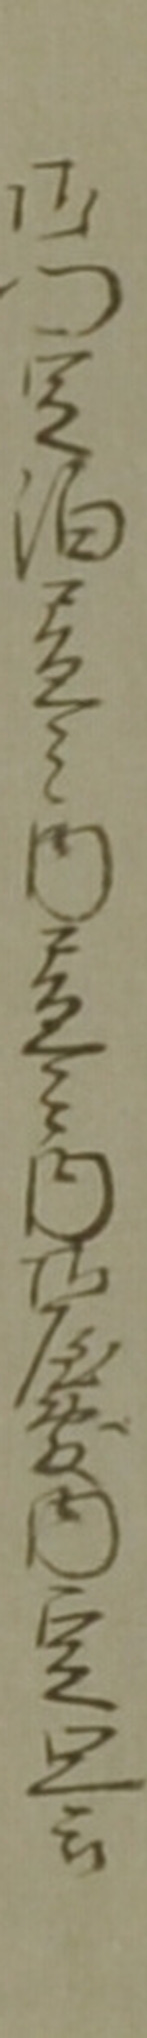御門定泊昼之内昼之内御屋敷内定廻被
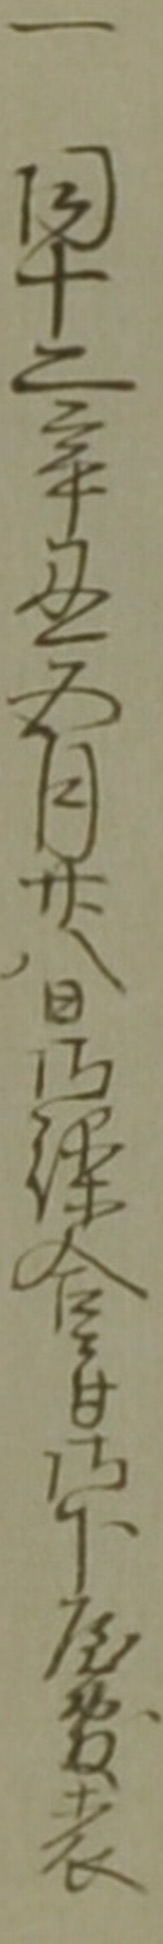一同十二辛丑五月廿八日御繰合ニ付御下屋敷表
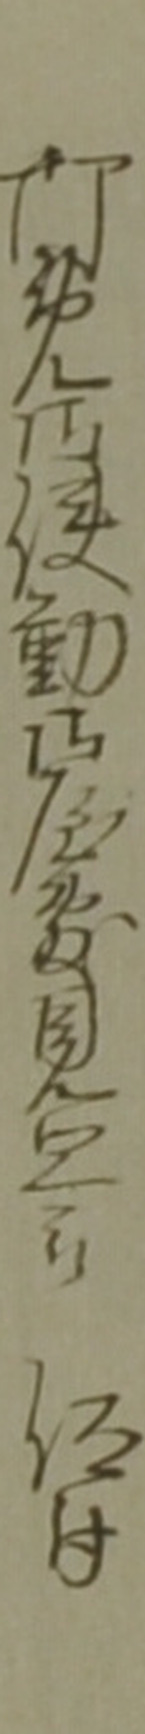御免御使勤御屋敷見廻被仰付

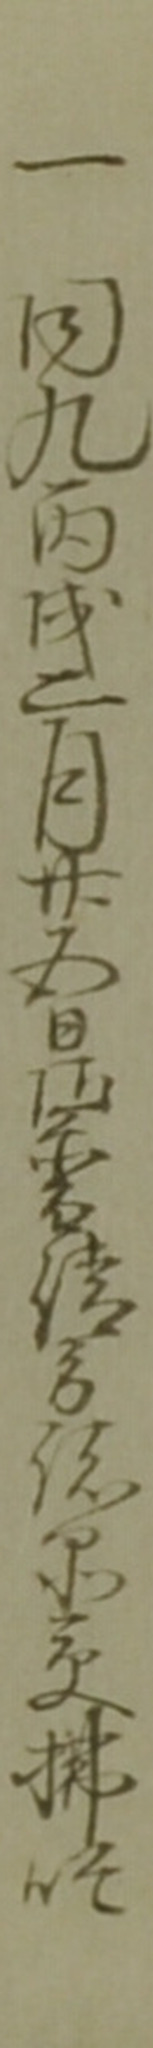一同九丙戌二月廿五日御普請方諸品受払吟
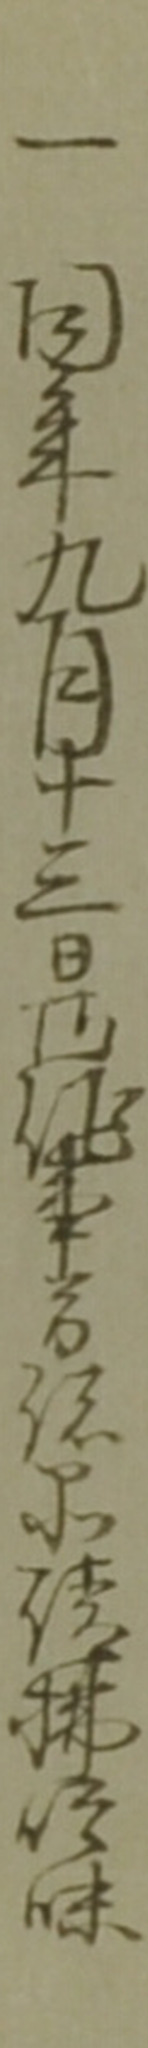一同年九月十三日御作事方諸品請払吟味
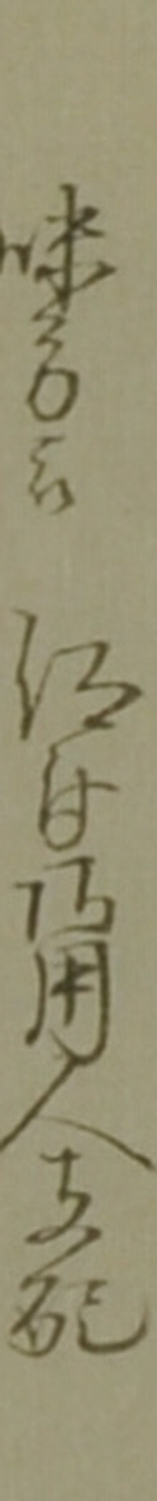味方被仰付御用人支配
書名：無足諸士勤仕録（五）
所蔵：伊那市立高遠町図書館・合同会社AMANE
